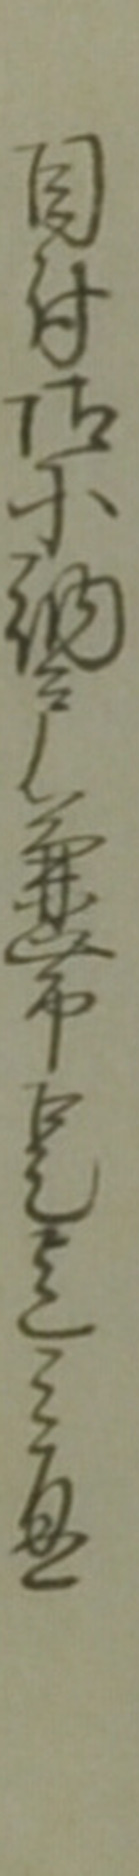目付御小納戸兼帯是迄之通
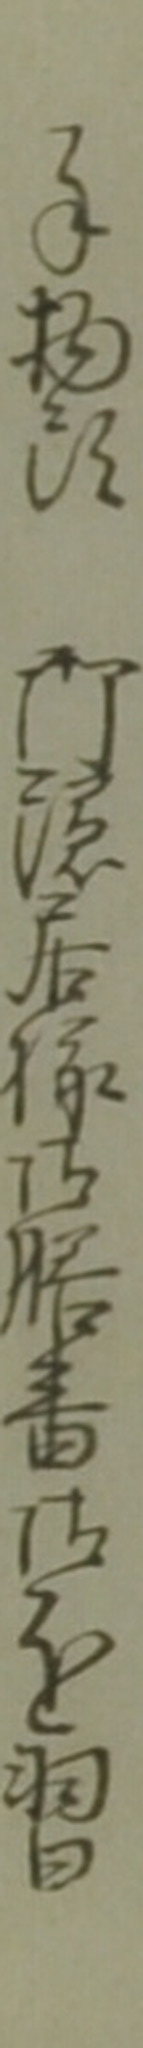手物頭御隠居様御膳番御近習
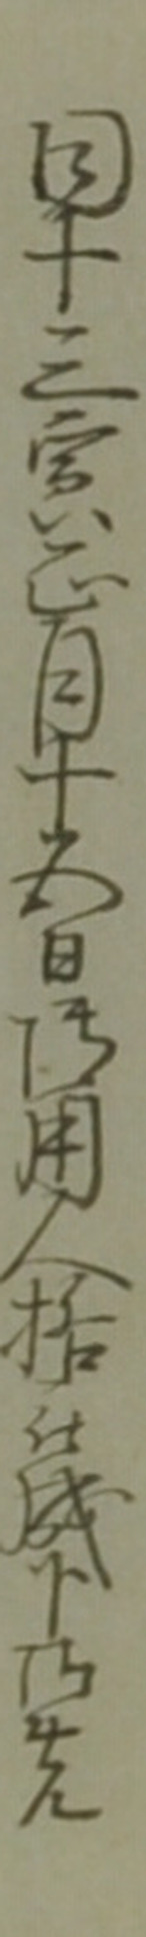一同十三寅正月十五日御用人格被成下御先
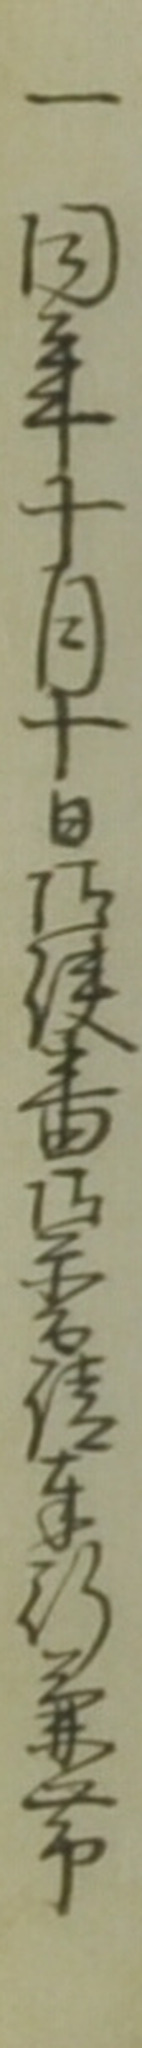一同年十月十日御使番御普請奉行兼帯
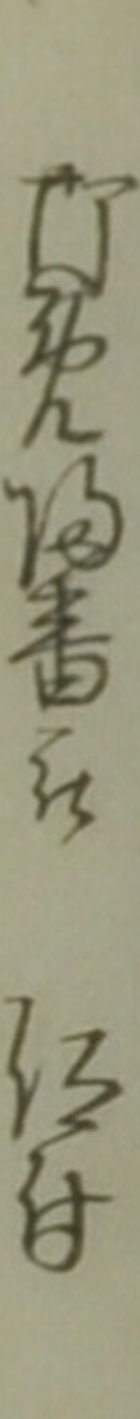御免帰番被仰付
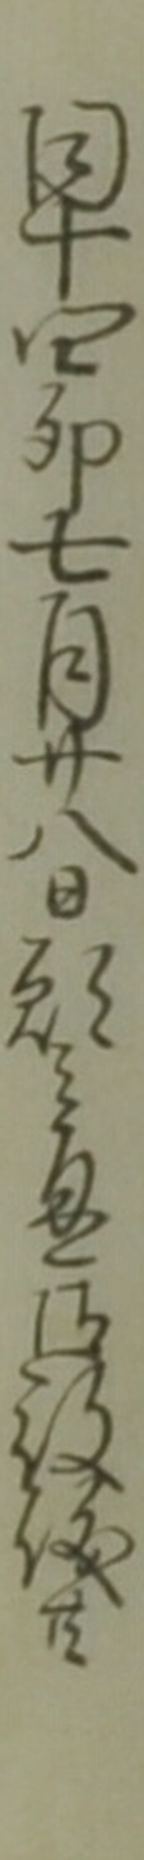一同十四卯七月廿八日願之通御役儀共

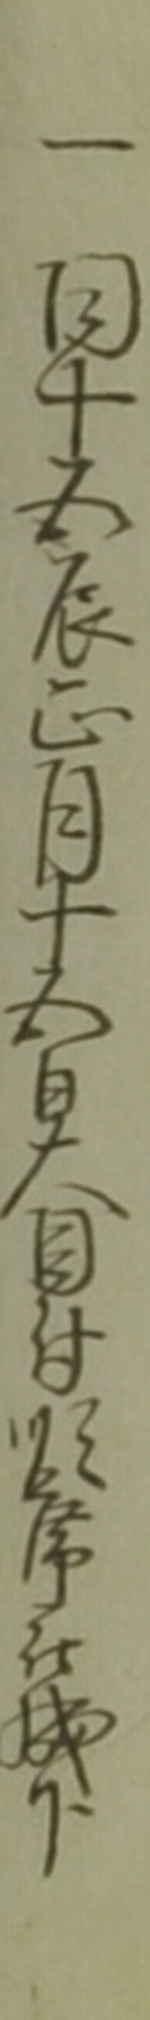一同十五辰正月十五日大目付順席被成下
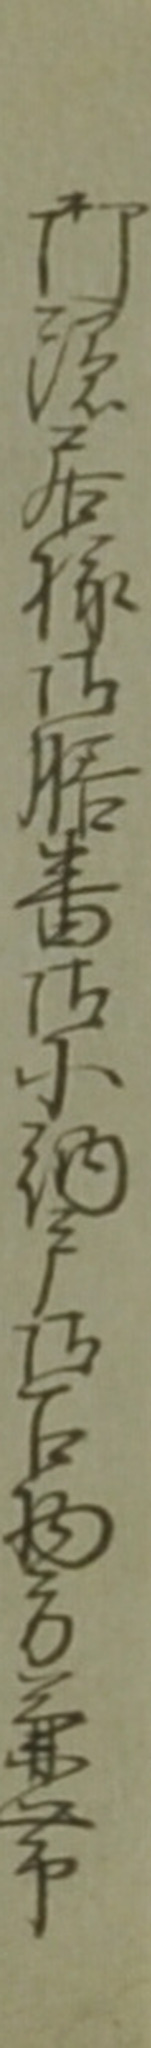御隠居様御膳番御小納戸御召物方兼帯
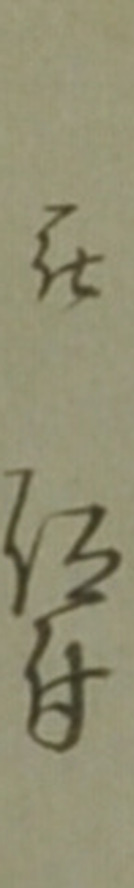被仰付
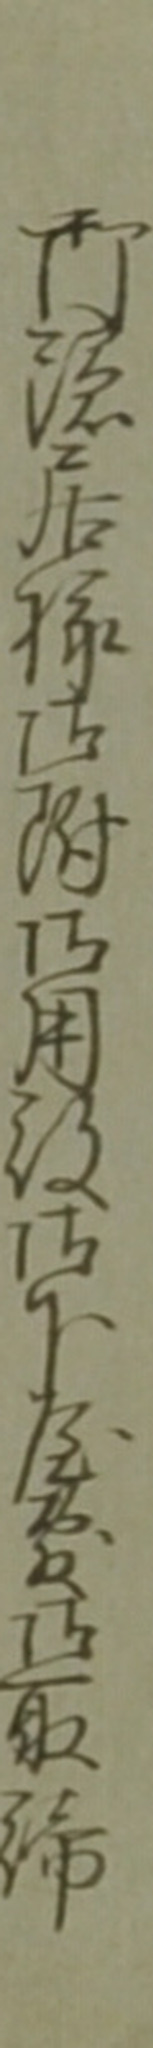御隠居様御附御用役御下屋敷御取締
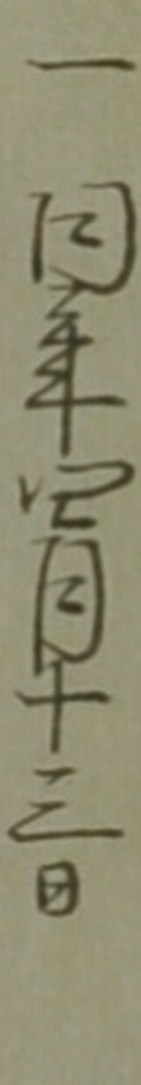一同年四月十三日
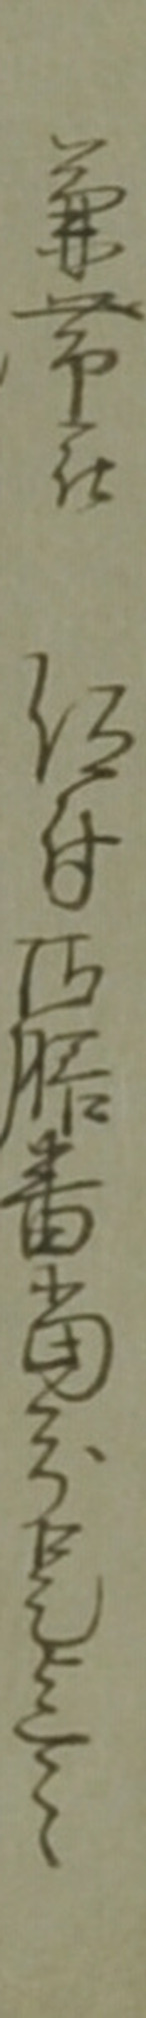兼帯被仰付御膳番当分是迄之
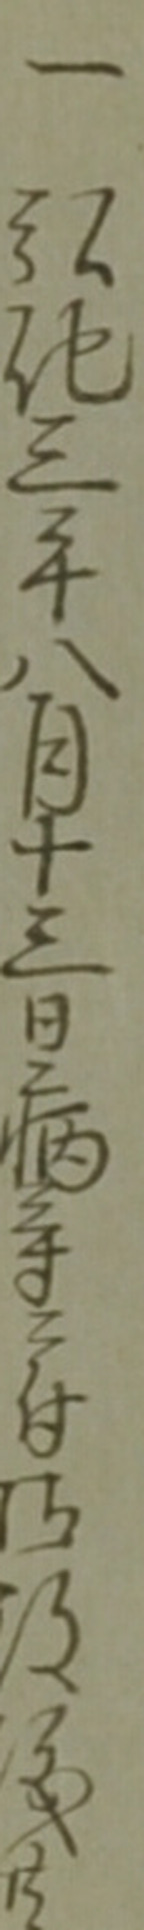一弘化三午八月十三日病気ニ付御役儀共
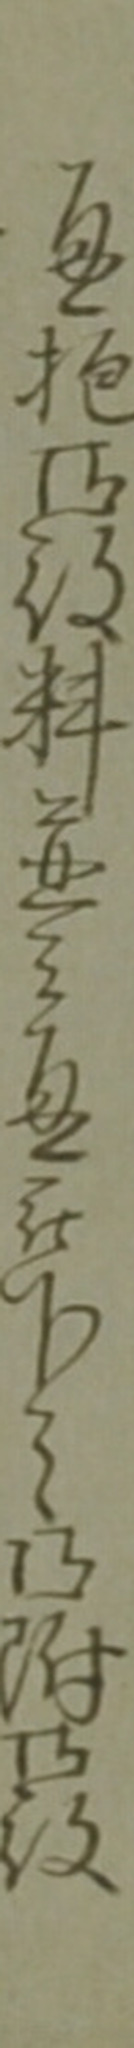通抱御役料並之通被下之御附御役
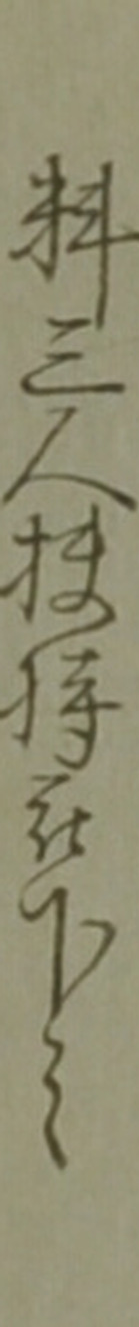料三人扶持被下之
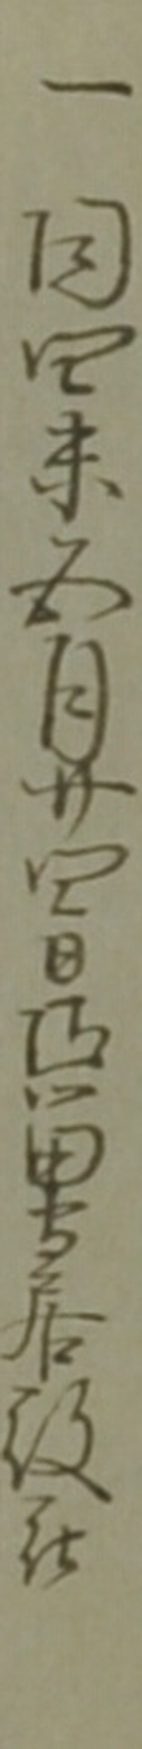一同四未五月廿四日御留守居役被
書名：給人諸士勤仕録（三）
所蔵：伊那市立高遠町図書館・合同会社AMANE
